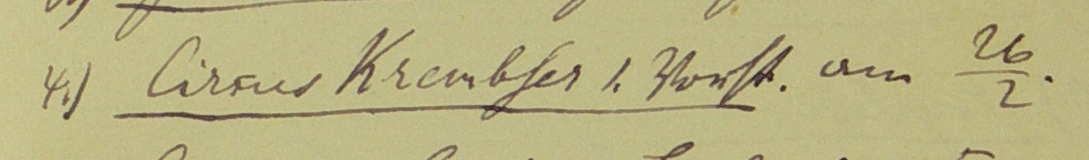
4.) Circus Krembses 1. Vorst. am 26/2
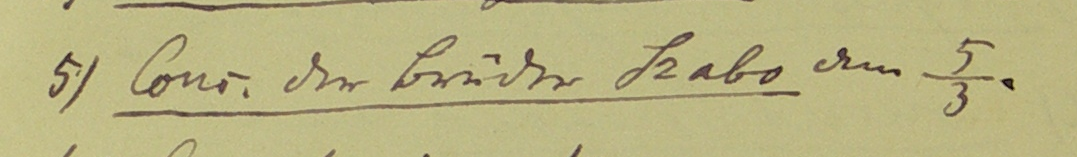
5.) Conc. Der Brüder Szabo am 5/3
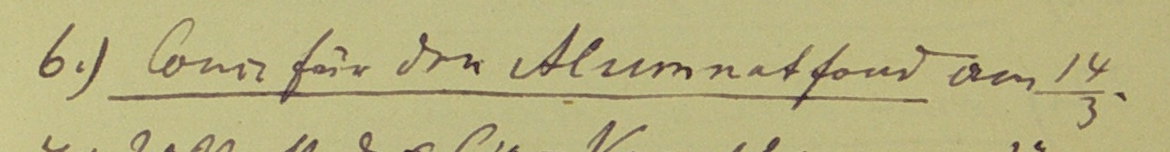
6) Conc. Für den Alumnatfond am 14/3
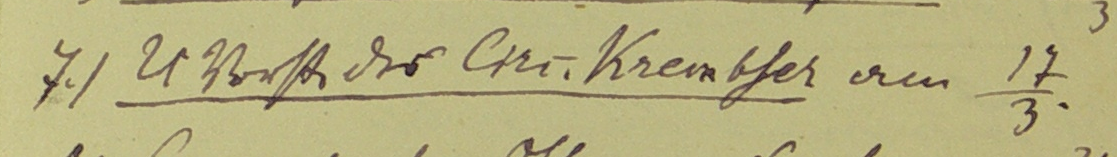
7.) 25. Vorst. des Circ. Krembses am 17/3
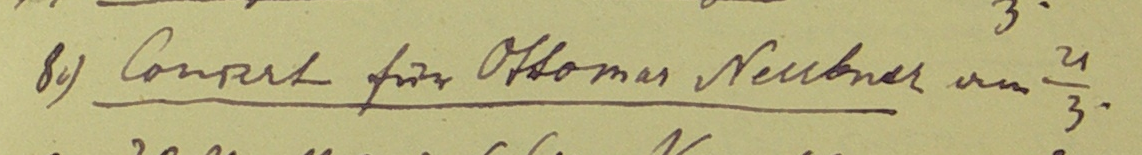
8.) Concert für Ottoma Neubau am 21/3
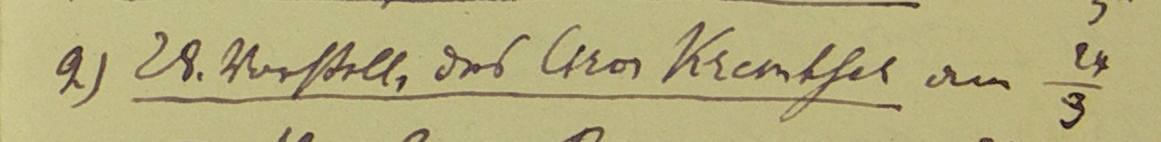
9.) 28. Vorst. des Circus Krembses am 24/3
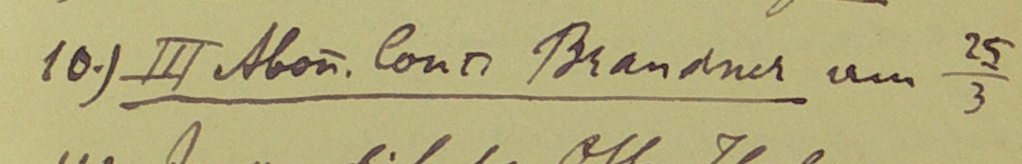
10.) III Abon. Conc. Brandner am 25/3
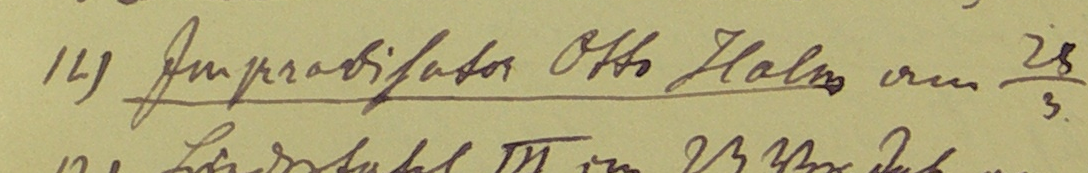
11.) Improvisator Otto Holm am 28/3
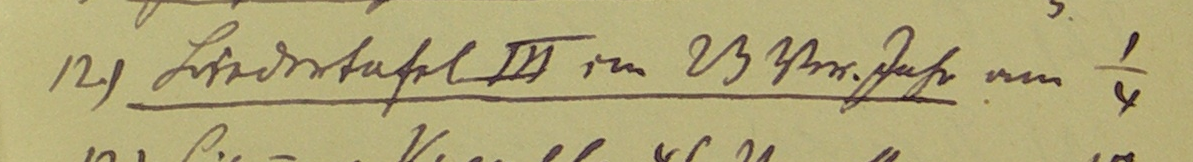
12.) Liedertafel III 23. Vorst. Jahr am 1/4
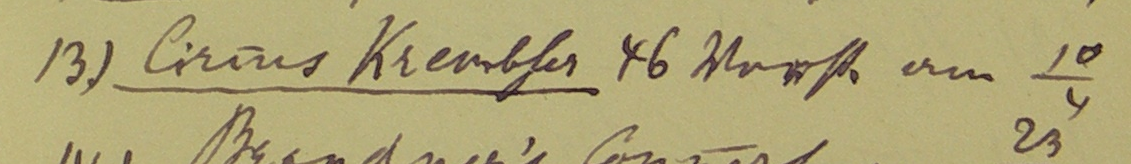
13.) Circus Krembses 46. Vorst. am 10/4
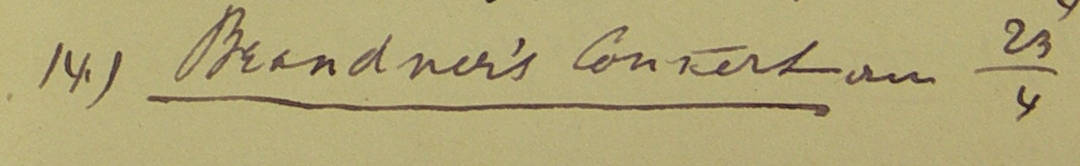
14.) Brandners Concert am 23/4
